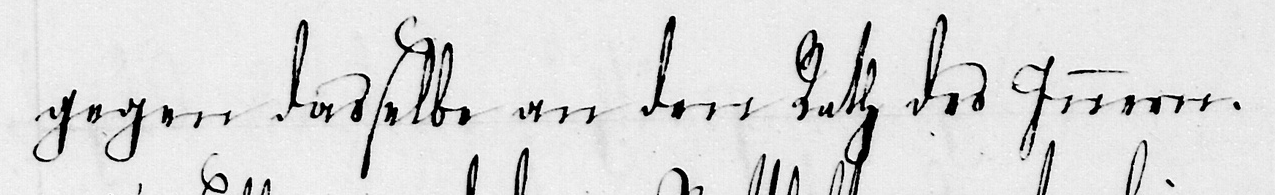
gegen dasselbe an den Rath des Innern.
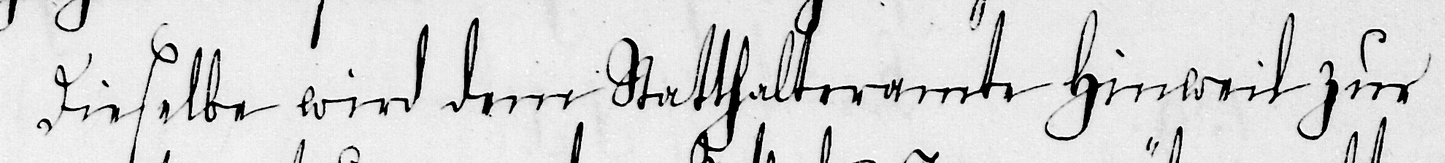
Dieselbe wird dem Statthalteramte Hinweil zur
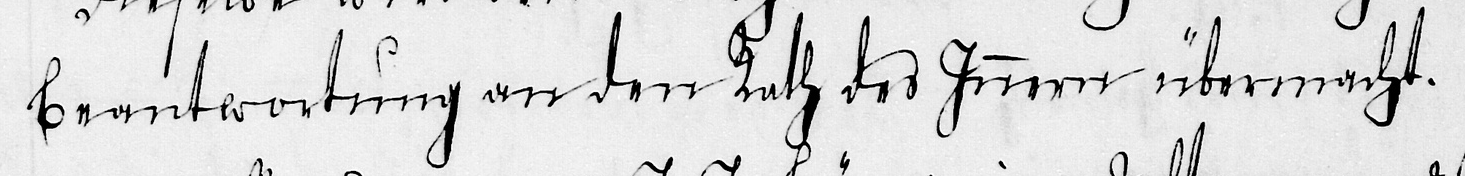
Beantwortung an den Rath des Innern übermacht.
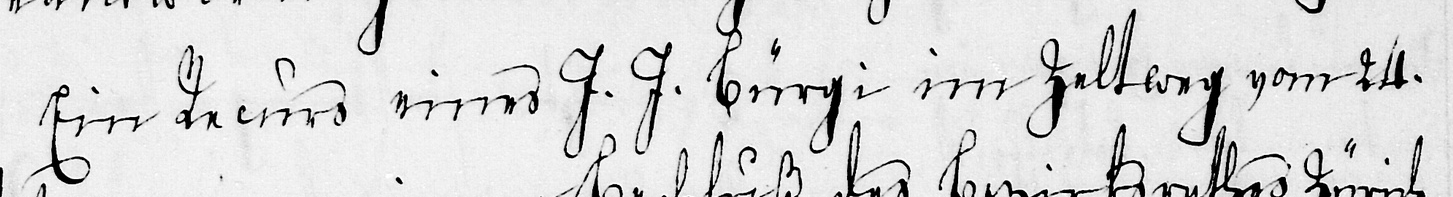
Ein Recurs eines J. J. Bürgi im Zeltweg vom 24.
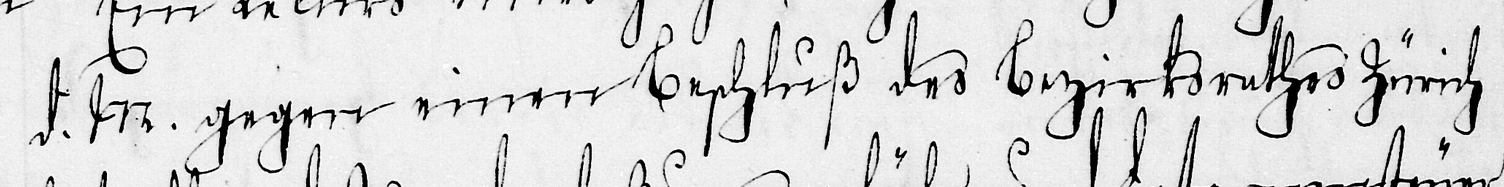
d. M. gegen einen Beschluß des Bezirksrathes Zürich
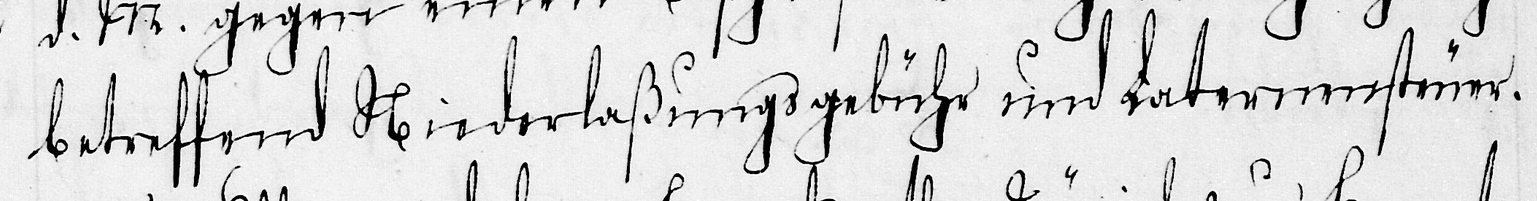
betreffend Niederlaßungsgebühr und Laternensteuer.
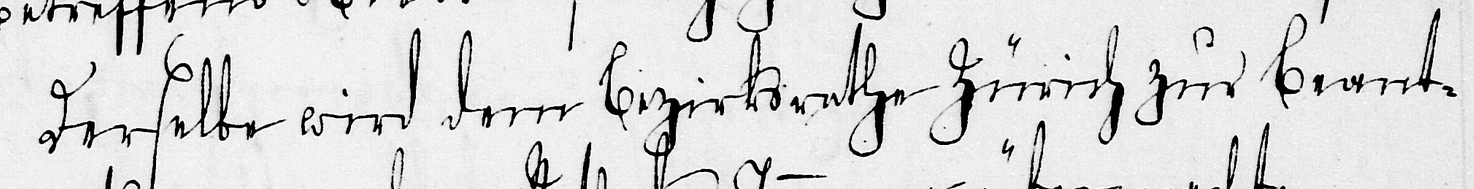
Derselbe wird dem Bezirksrathe Zürich zur Beant¬
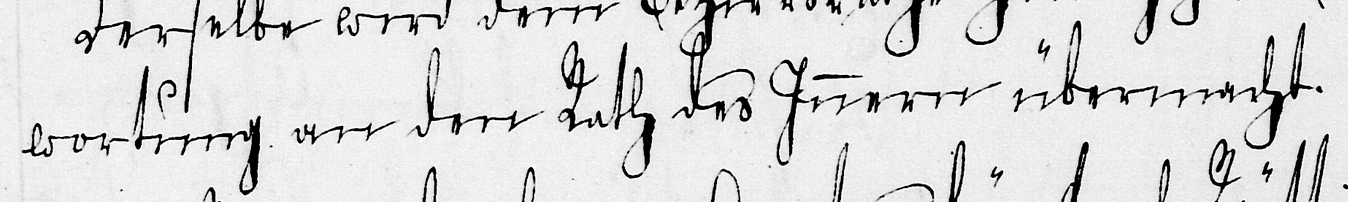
wortung an den Rath des Innern übermacht.
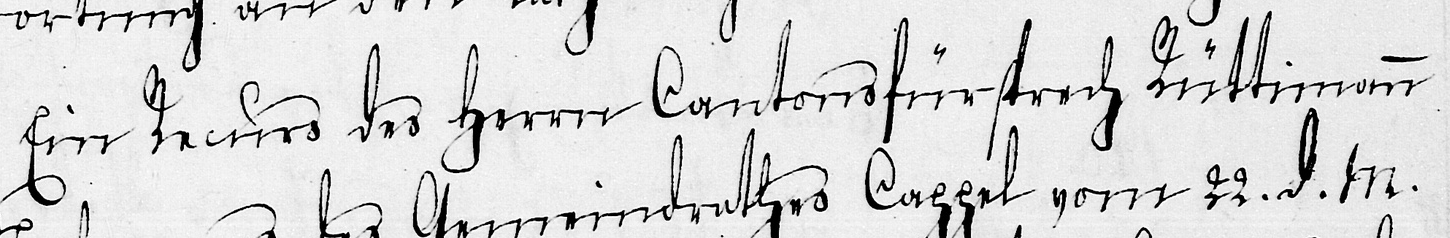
Ein Recurs des Herrn Cantonsfürsprech Rüttimann
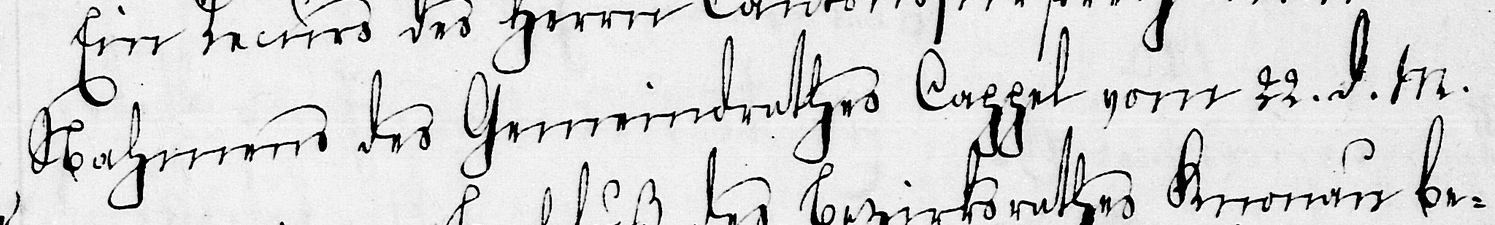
Nahmens des Gemeindrathes Cappel vom 22. d. M.
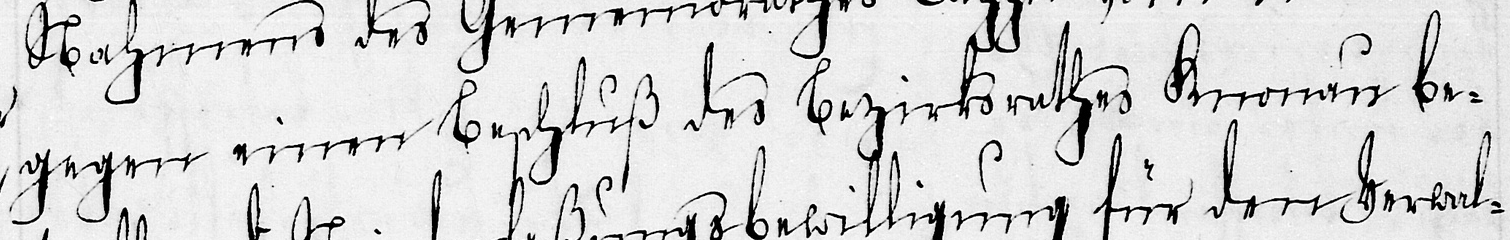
gegen einen Beschluß des Bezirksrathes Knonau be¬
